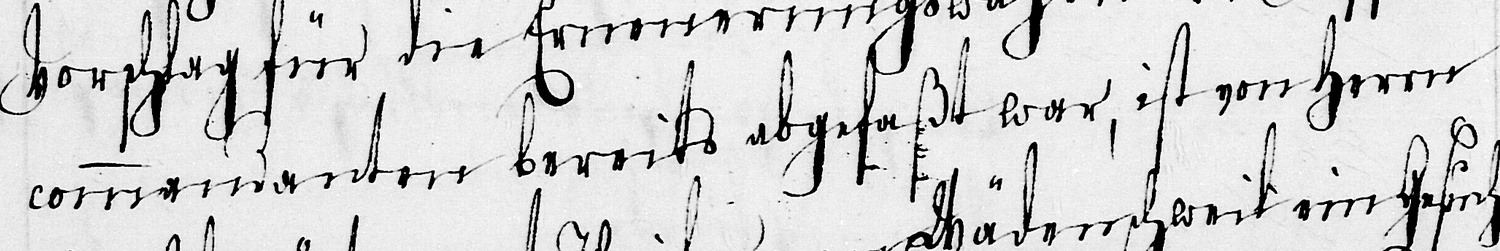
commandanten bereits abgefaßt war, ist von Herrn
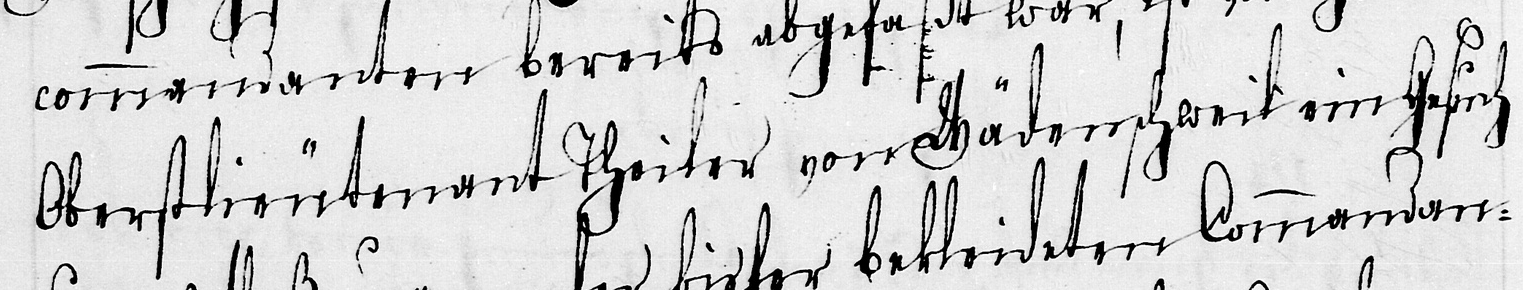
Oberstlieutenant Theiler von Wädenschweil ein
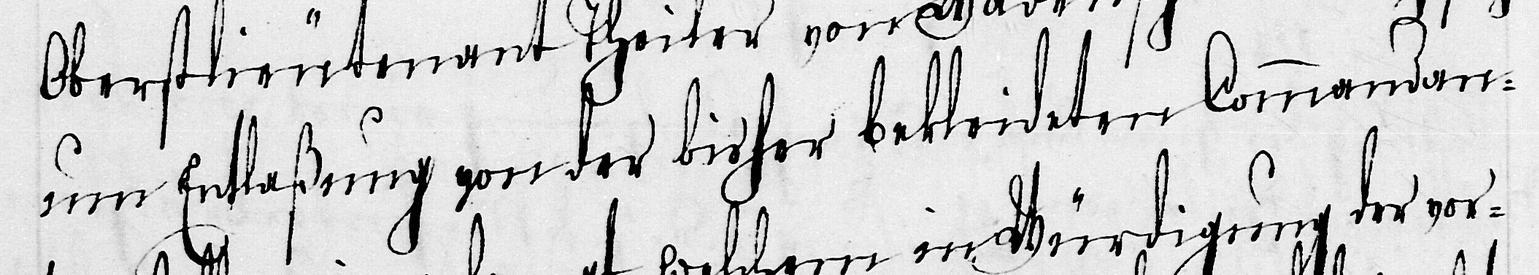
um Entlaßung von der bisher bekleideten Commandan¬
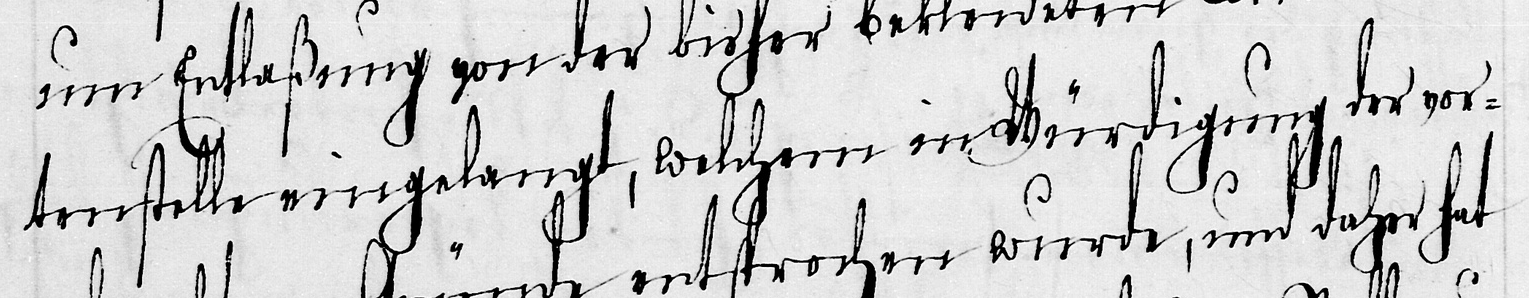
tenstelle eingelangt, welchem in Würdigung der vor¬
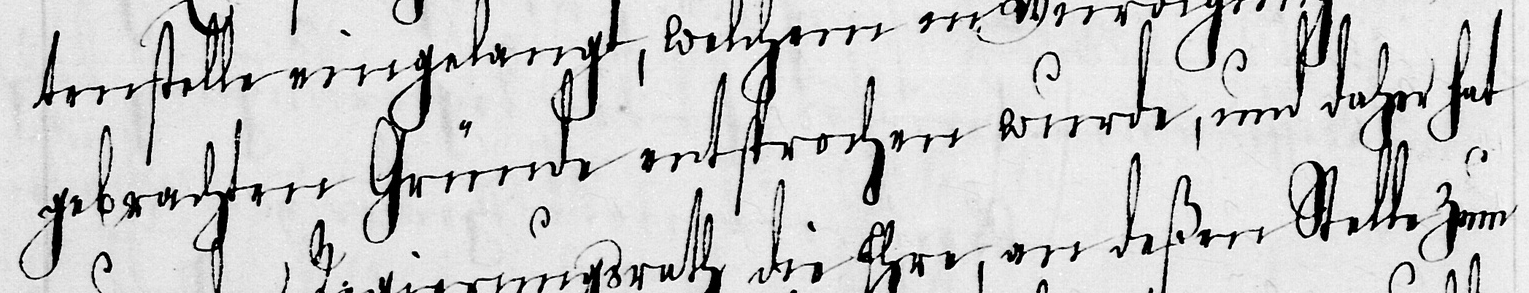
gebrachten Gründe entsprochen wurde, und daher hat
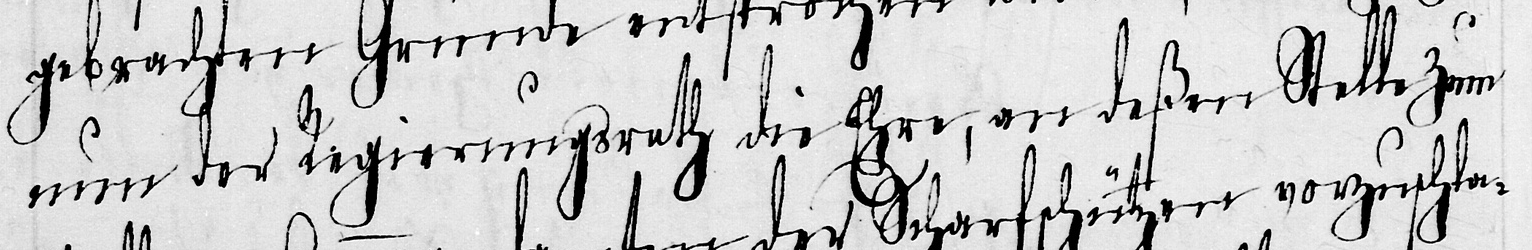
nun der Regierungsrath die Ehre, an deßen Stelle zum
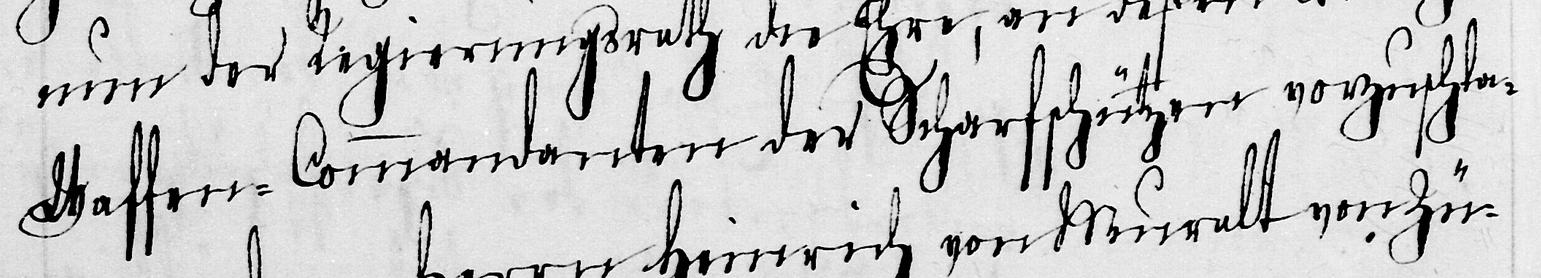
Waffen-Commandanten der Scharfschützen vorzuschla¬
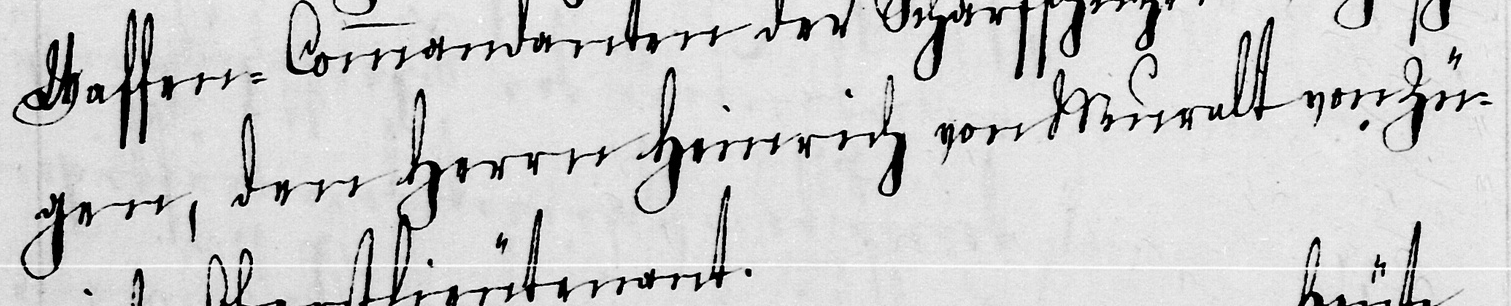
gen, den Herrn Heinrich von Muralt von Zü¬
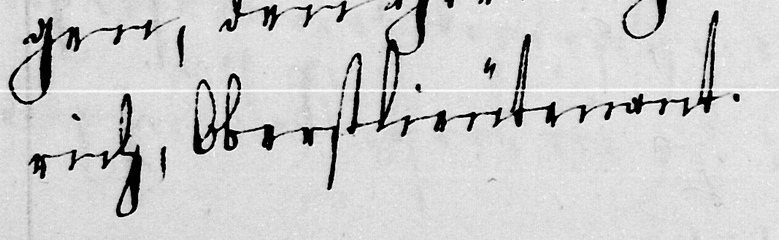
rich, Oberstlieutenant.
